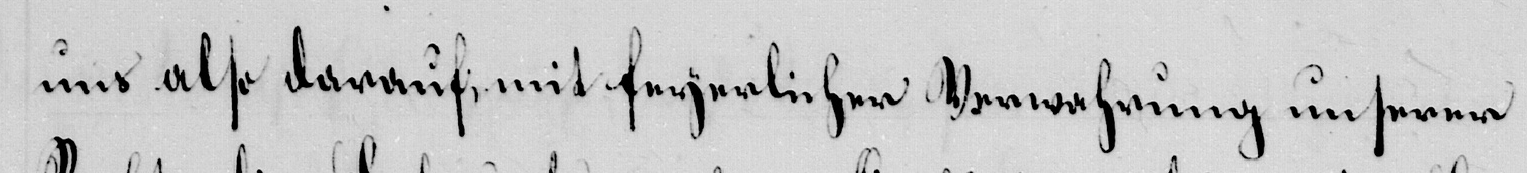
uns also darauf, mit feyerlicher Verwahrung unserer
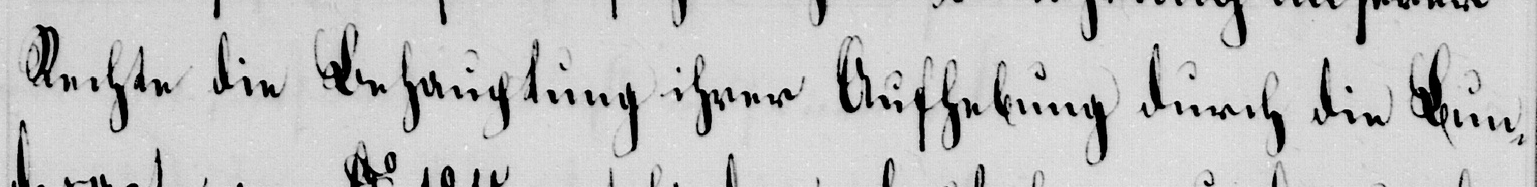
Rechte die Behauptung ihrer Aufhebung durch die Bun¬
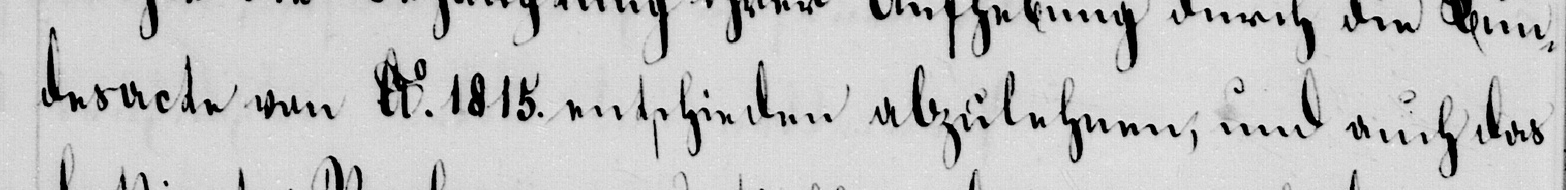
desacte von Ao. 1815. entschieden abzulehnen, und auch das
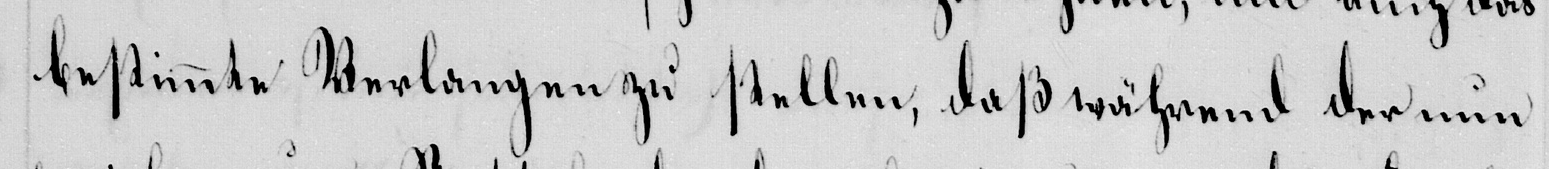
bestimmte Verlangen zu stellen, daß während der nun
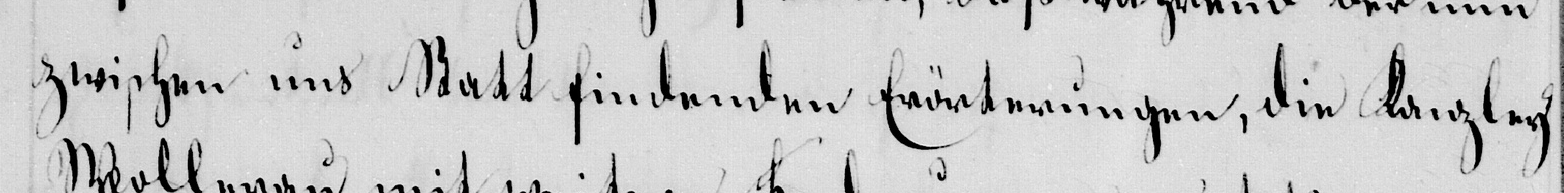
zwischen uns Statt findenden Erörterungen, die Kanzley
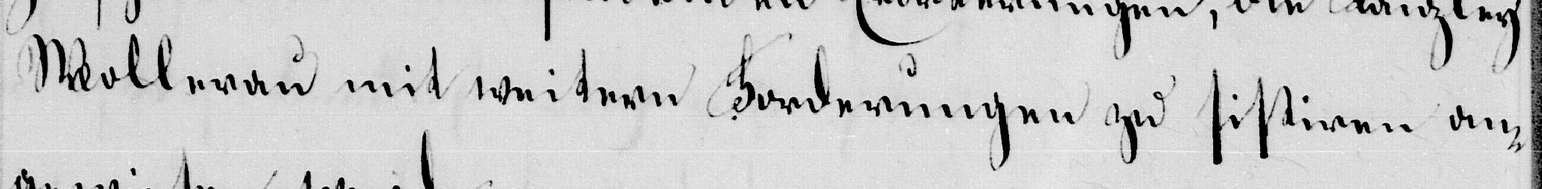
Wollerau mit weitern Forderungen zu sistiren an¬
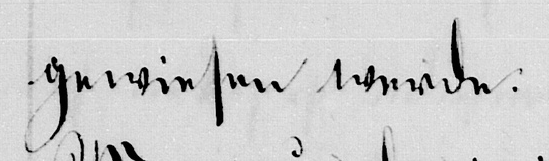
gewiesen werde.
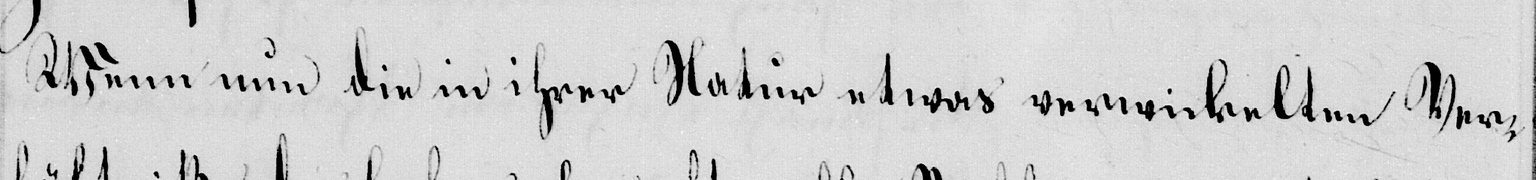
Wenn nun die in ihrer Natur etwas verwinkelten Ver¬
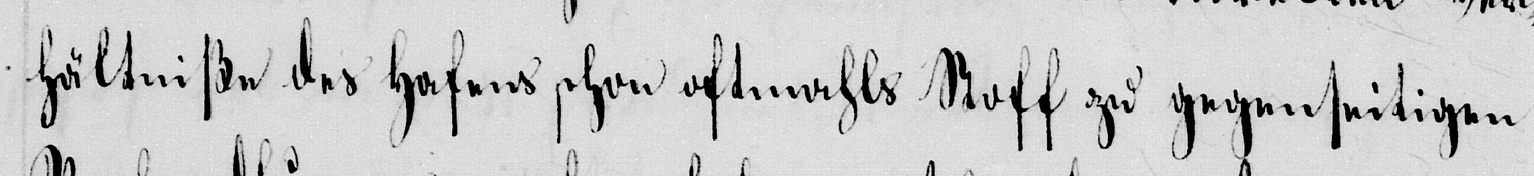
hältniße des Hafens schon oftmals Stoff zu gegenseitigen
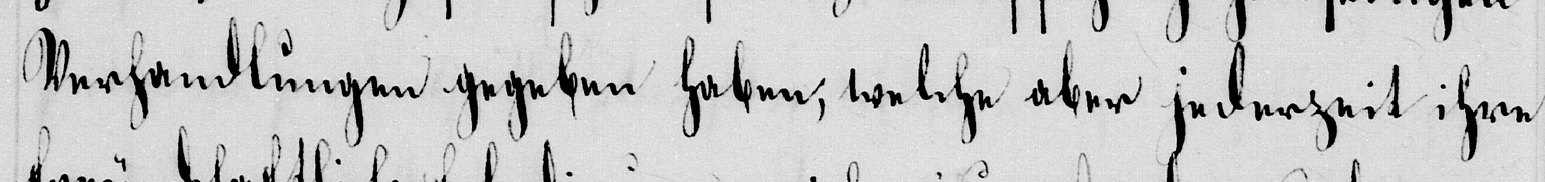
Verhandlungen gegeben haben, welche aber jederzeit ihre
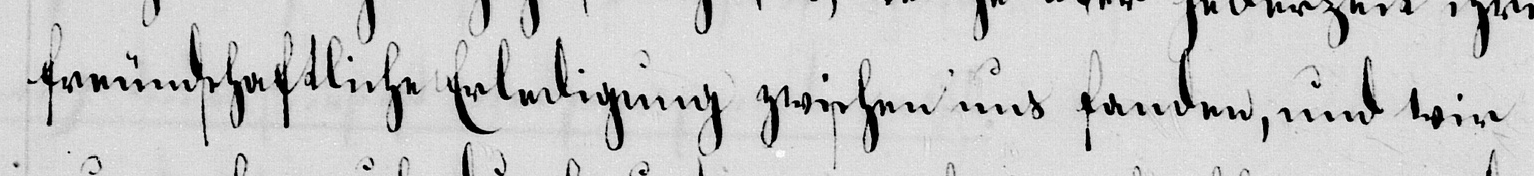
freundschaftliche Erledigung zwischen uns fanden, und wir
